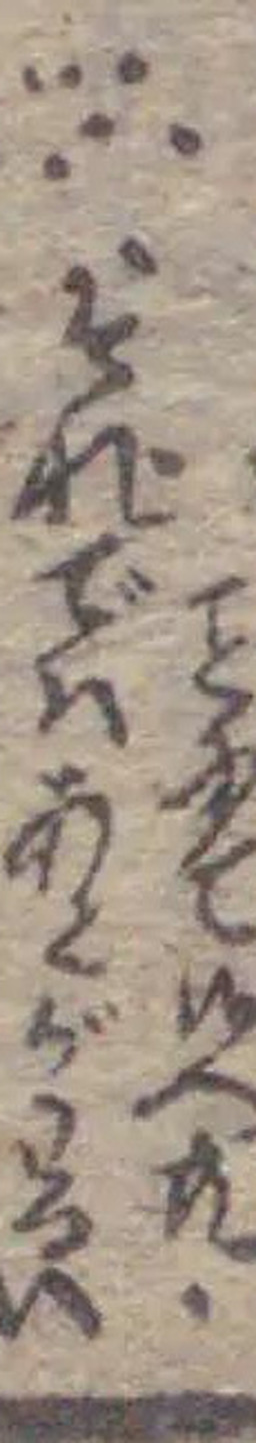それではあとがわるい
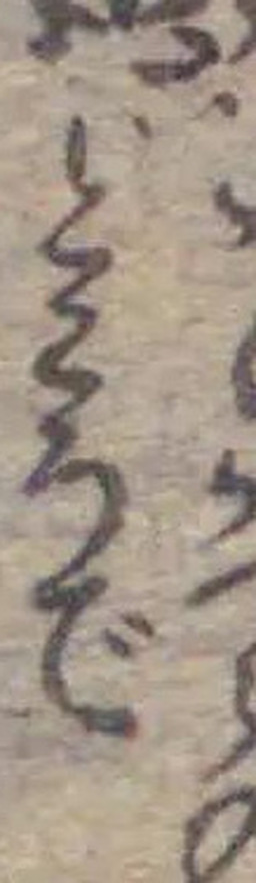ところで
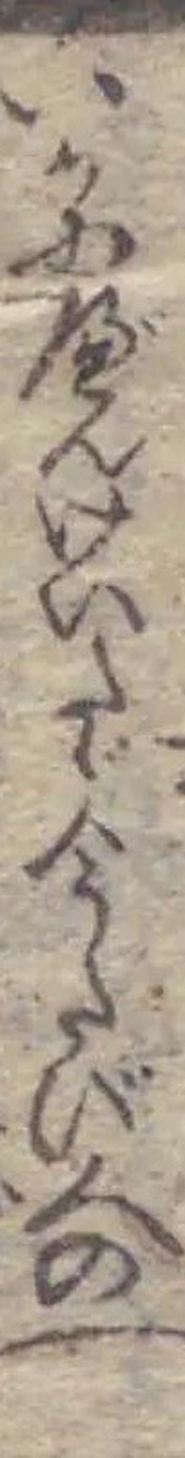いかにべんけいたゞ今たび人の
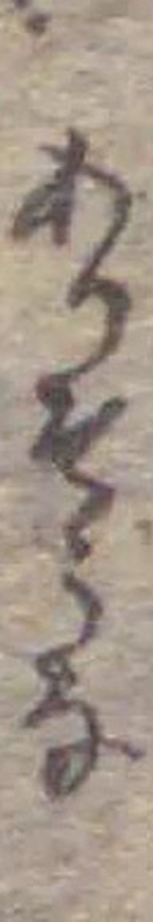ありそうな
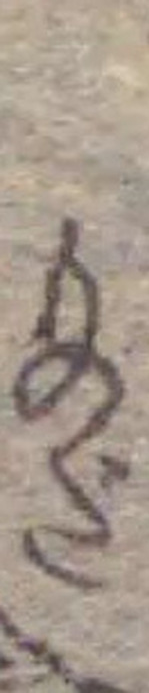ものだ
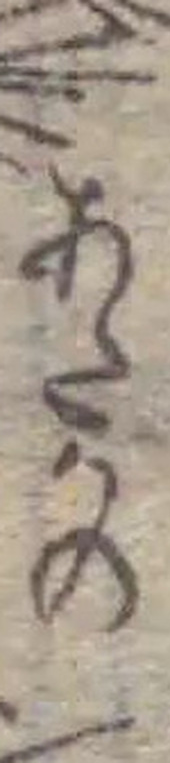あたかの
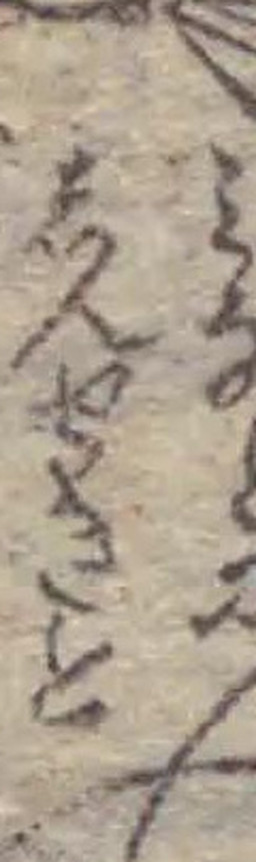しんせきを
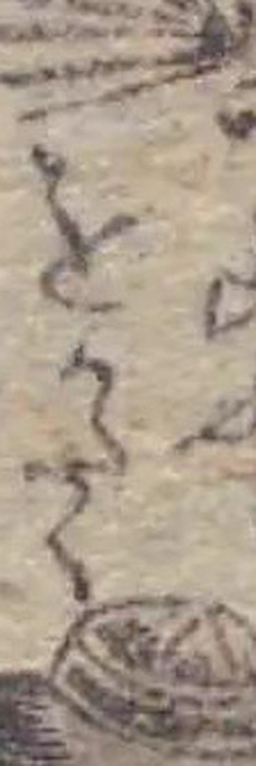をかたく
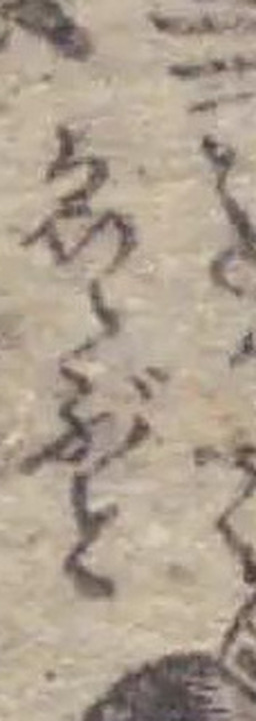ゑらぶと

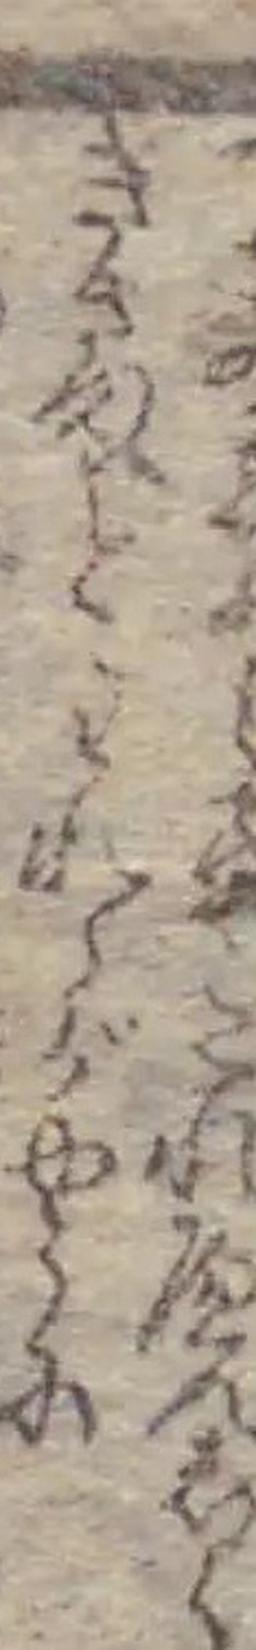きさまとわれらがやうに
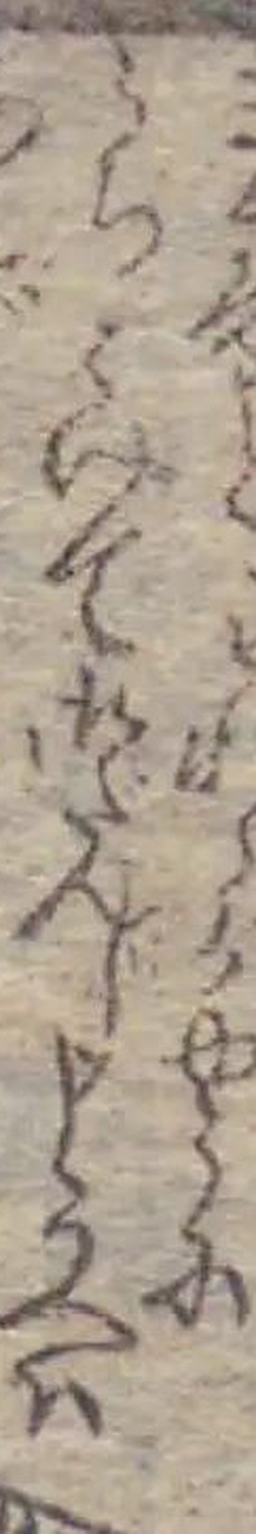うちとけて御だんじ申うへは
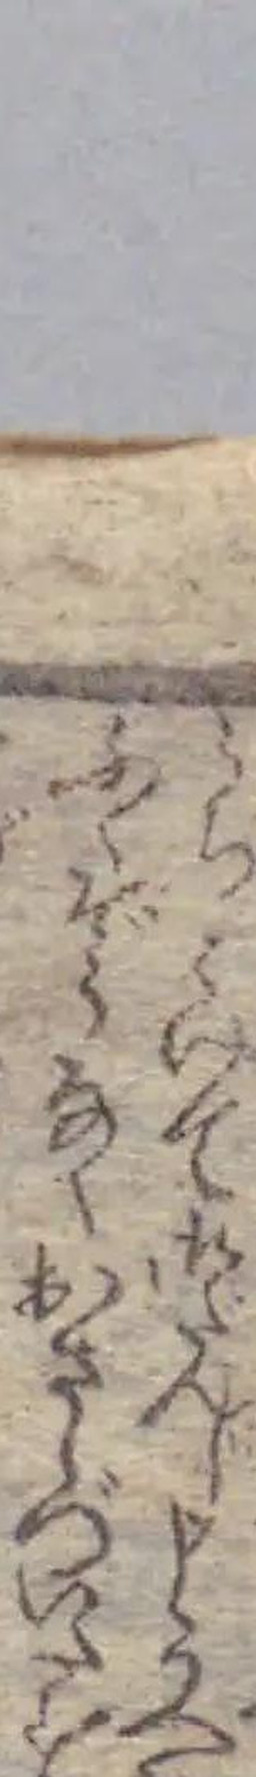ふくぞうなくおさしづいたす
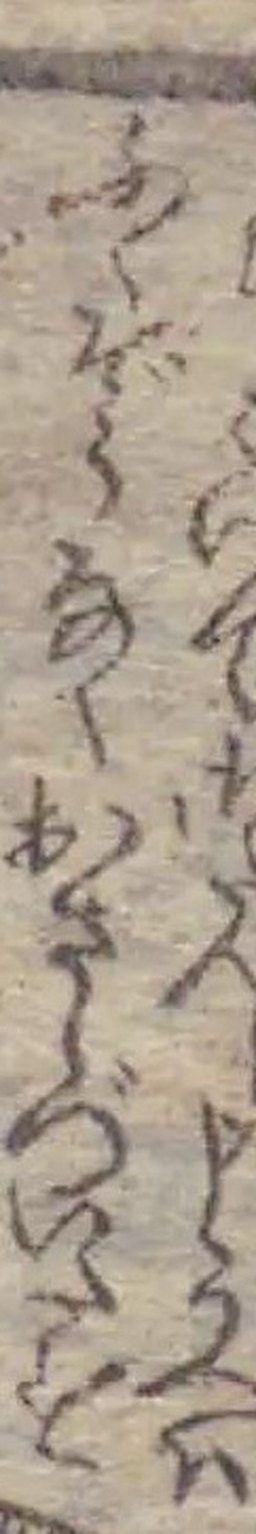ふくぞうなくおさしづいたす
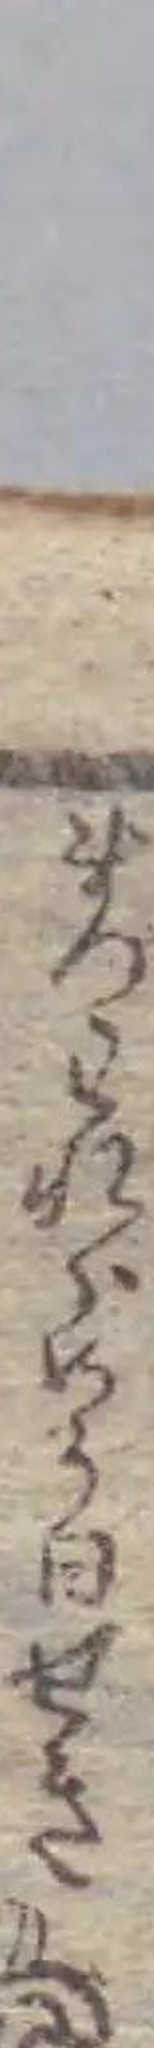まづわれらめう日せき
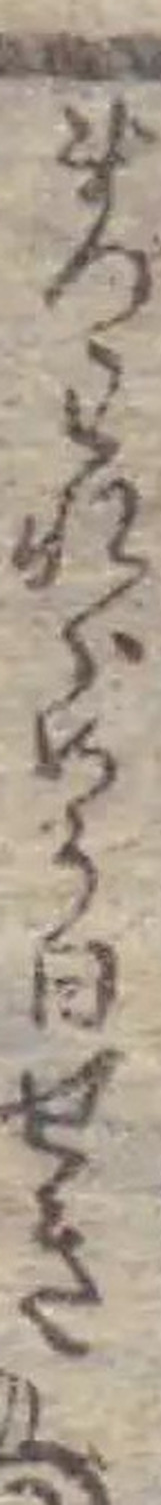まづわれらめう日せき
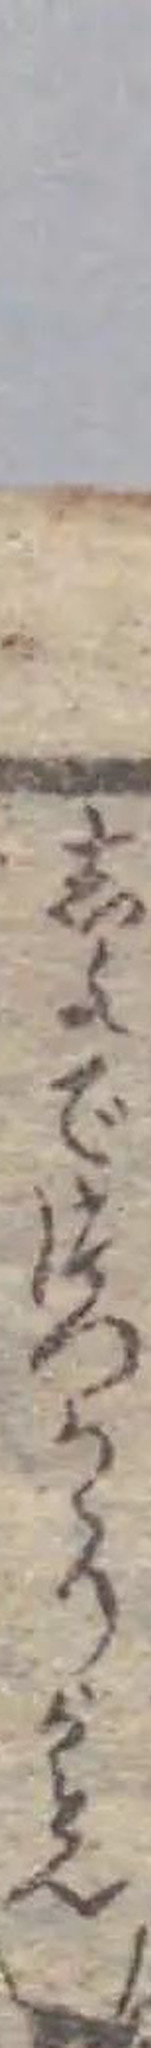しよでつつかゝりかとん
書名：通増安宅関 2巻
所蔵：国立国会図書館 National Diet Library, JAPAN
